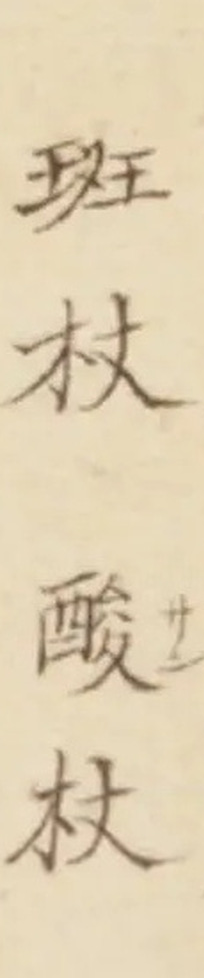班杖酸杖
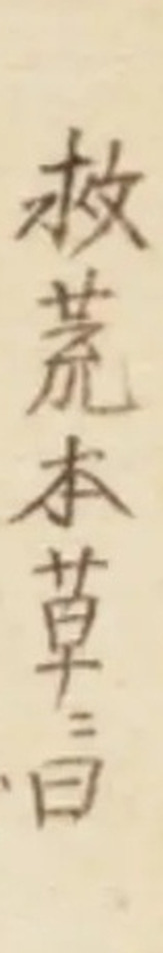救荒本草に曰
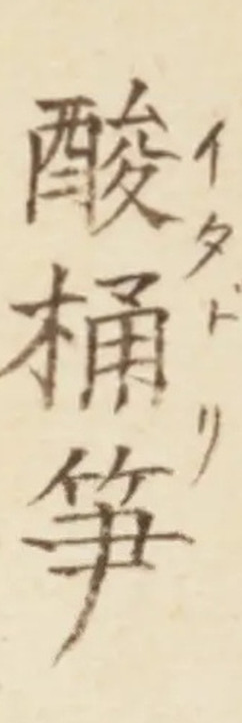酸桶笋
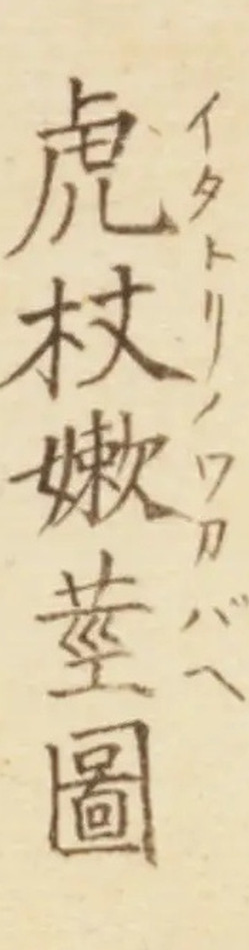虎杖嫩莖圖

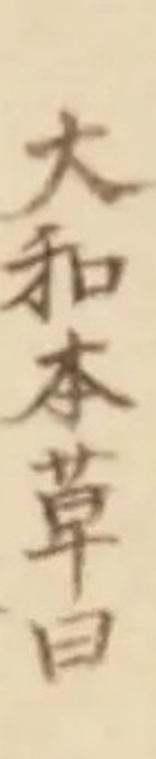大和本草曰
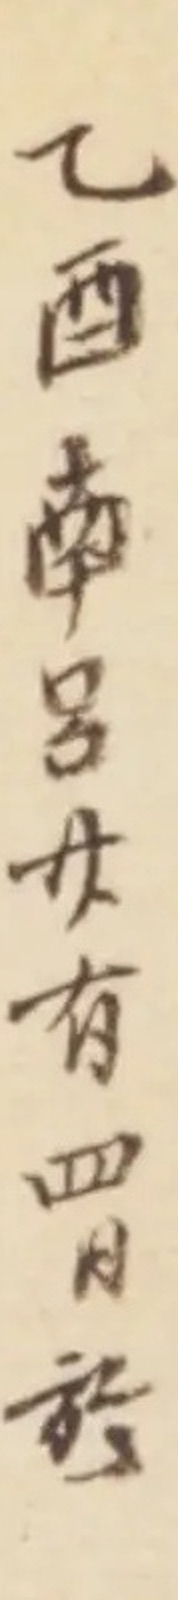乙酉南呂廿有四日於
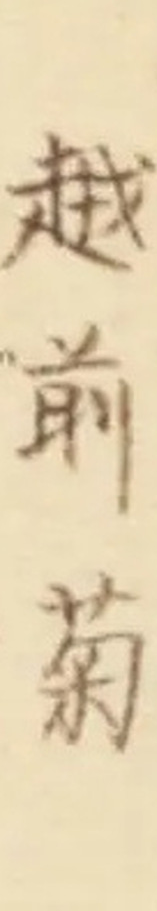越前菊

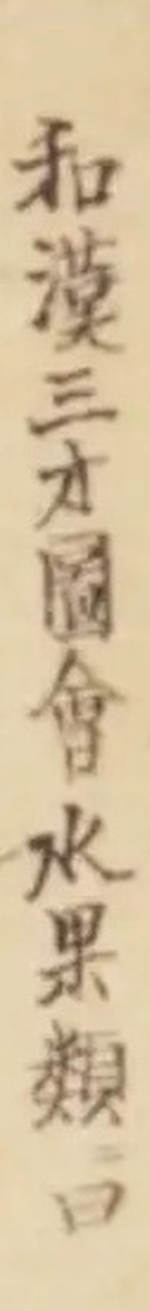和漢三才圖會水果類に曰
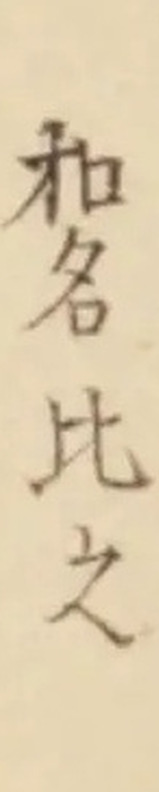和名比之
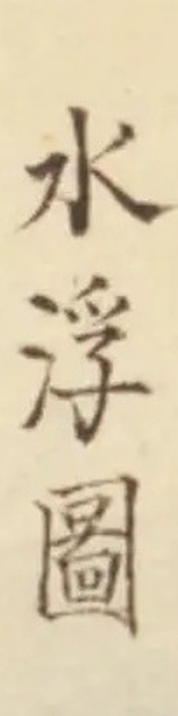水浮圖
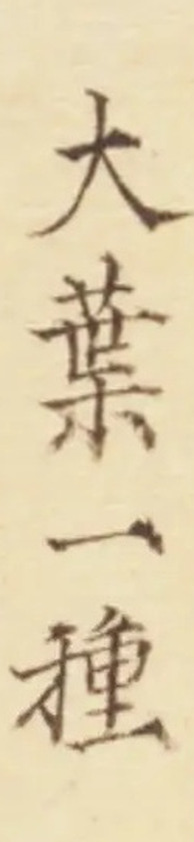大葉一種
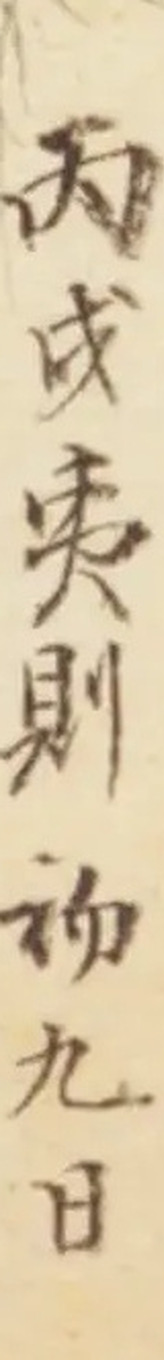丙戌夷則初九日
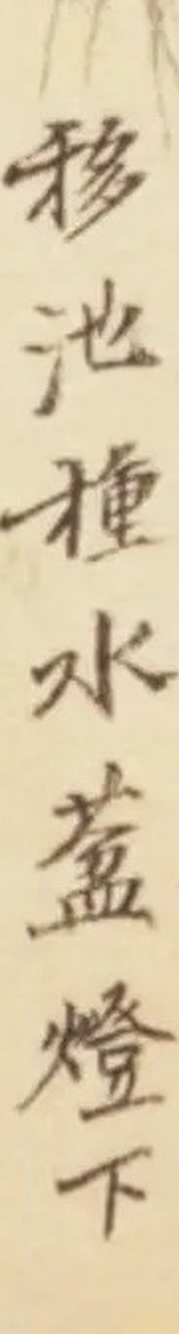移池種水燈下

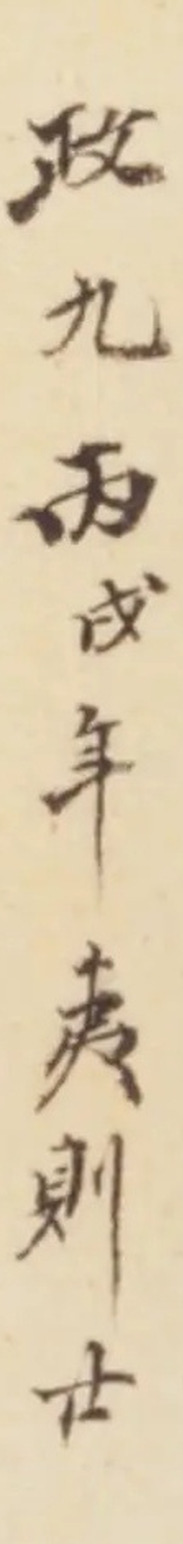政九丙戌夷則廿
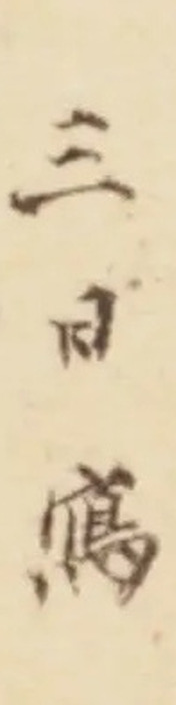三日寫
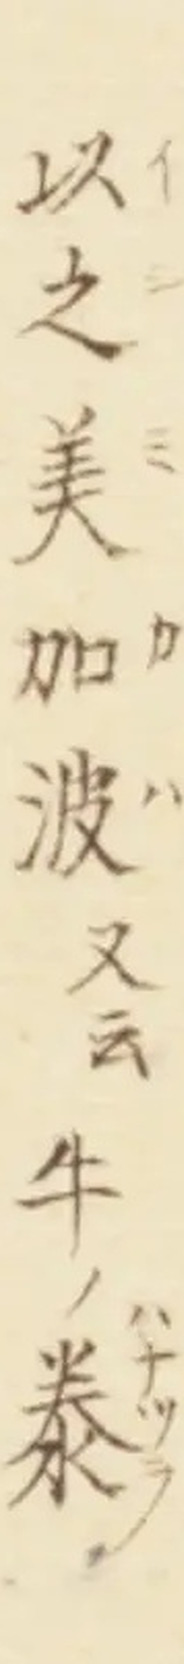以之美加波又云牛の
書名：梅園草木花譜秋之部. 3
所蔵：国立国会図書館 National Diet Library, JAPAN
